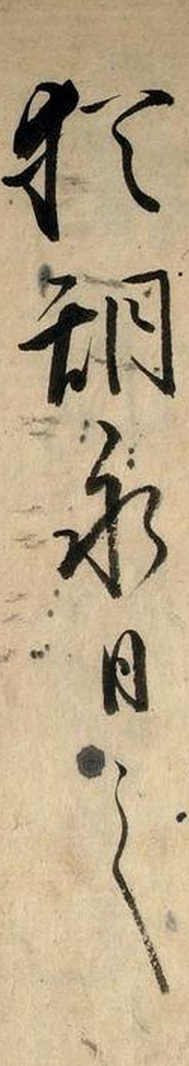猶期永日之
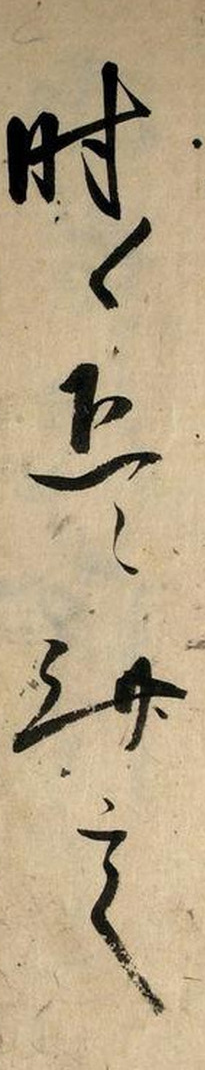時候恐々謹言
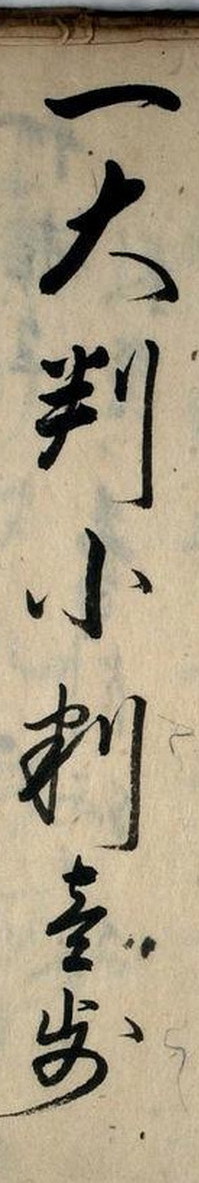一大判小判壱歩

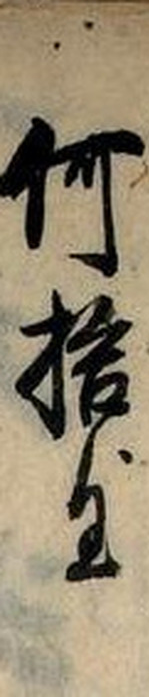何拾匁
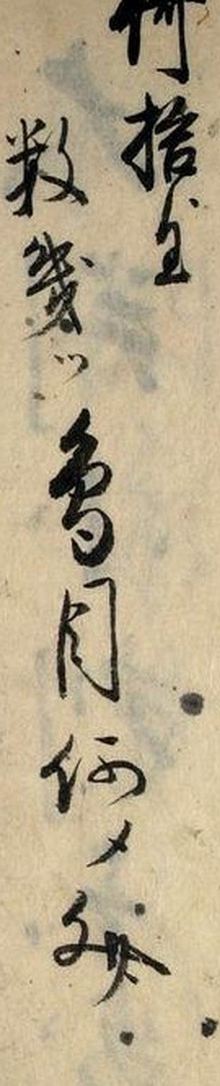数幾ツ鳥目何〆文
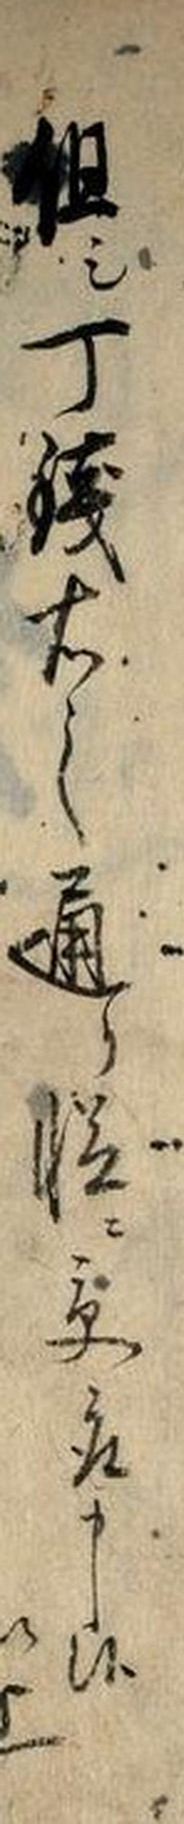但シ丁銭右之通リ慥ニ受取申候
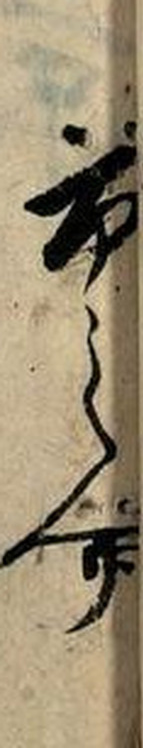市之介
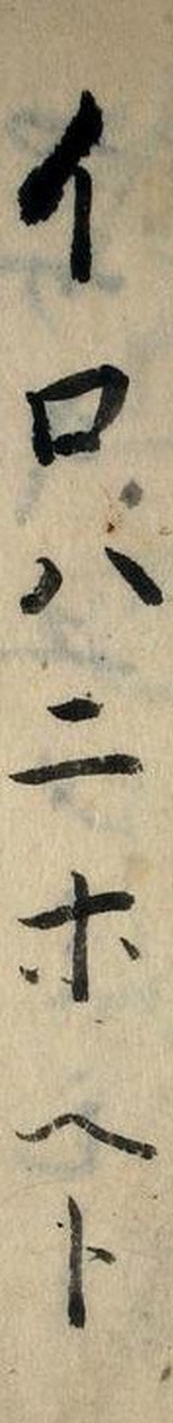イロハニホヘト
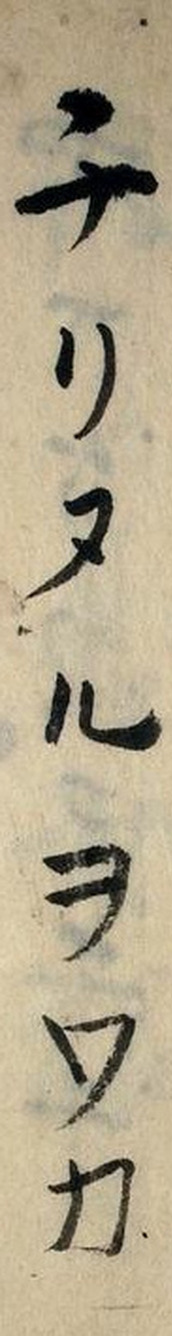チリヌルヲワカ
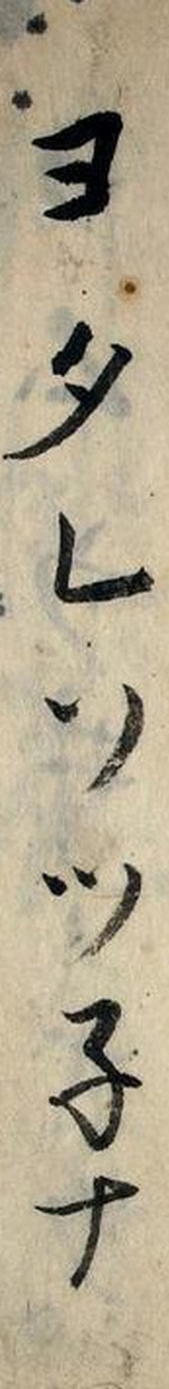ヨタレソツネナ

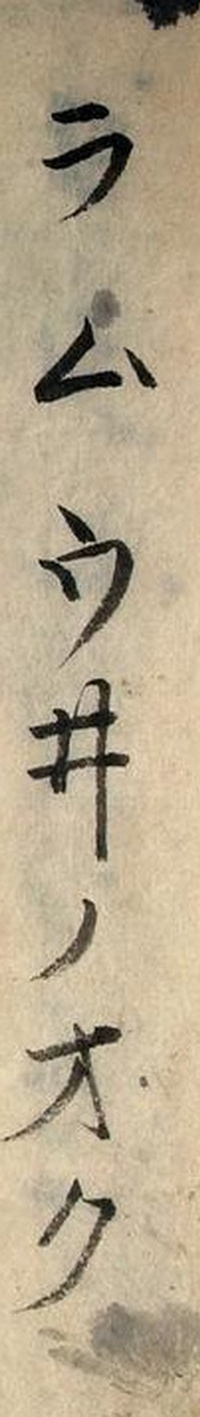ラムウヰノオク
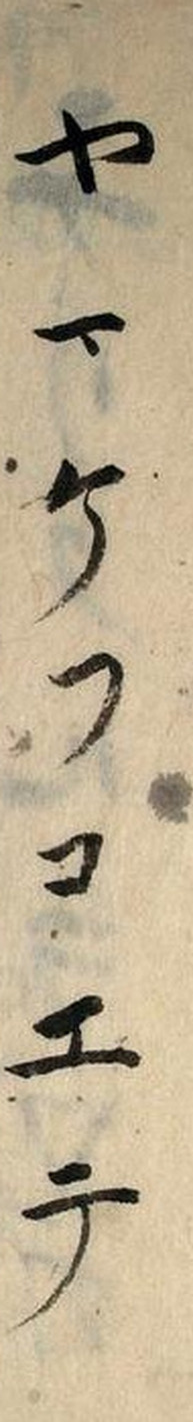ヤマケフコエテ
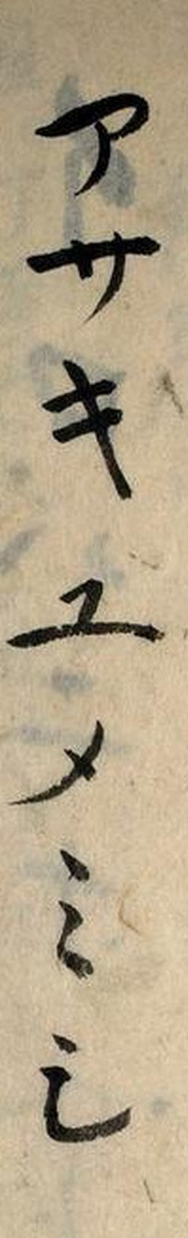アサキユメミシ
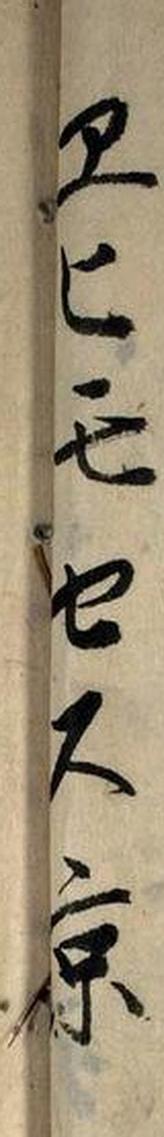ヱヒモセス京
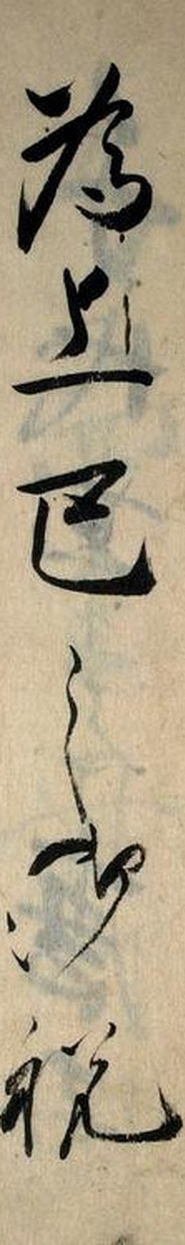為上巳之御祝
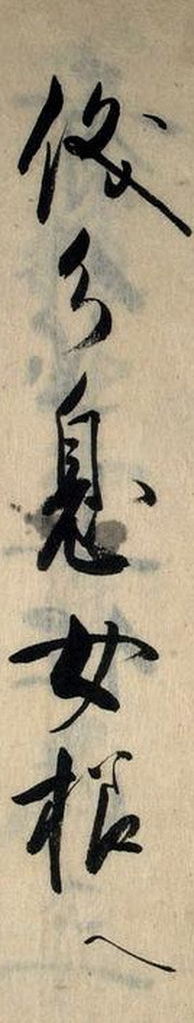儀御息女様へ
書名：御手本（手習、消息文、和漢朗詠集・論語の一節）
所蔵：福井県文書館 Fukui Prefectural Archives
